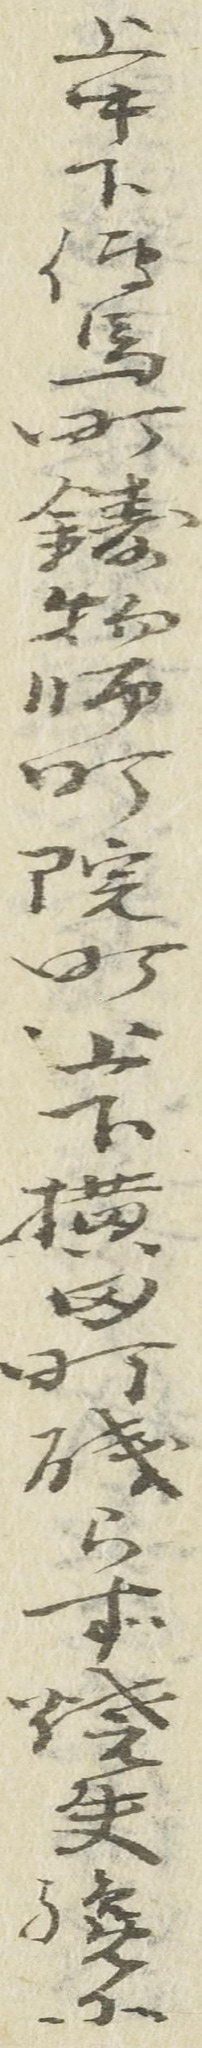上中下伝馬町鋳物師町院町上下横田町残らず焼失纔に
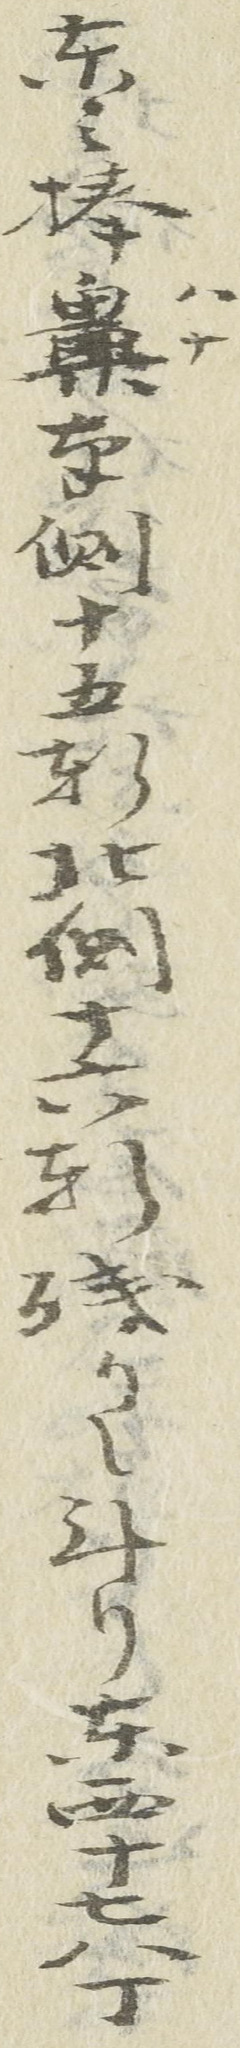東の棒鼻南側十五軒北側十六軒残りし計り東西十七八丁
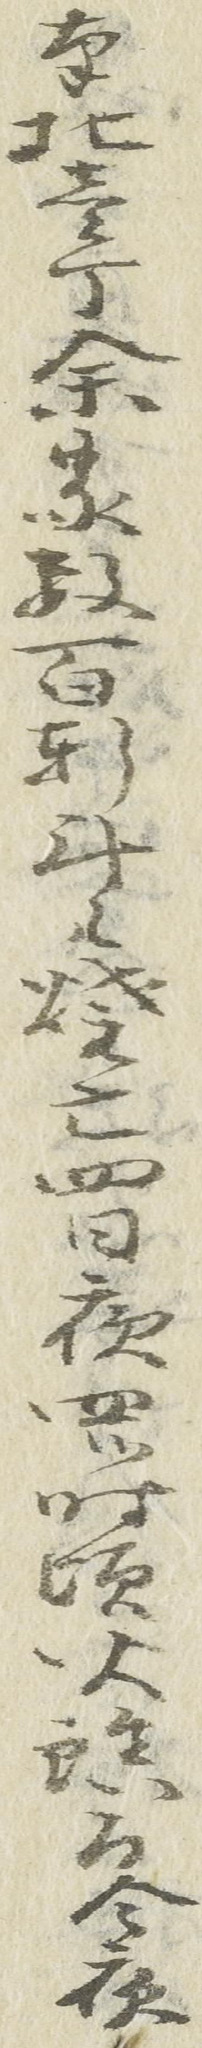南北壱丁余家数百軒計も焼亡四日夜四ツ時頃火鎮而今夜
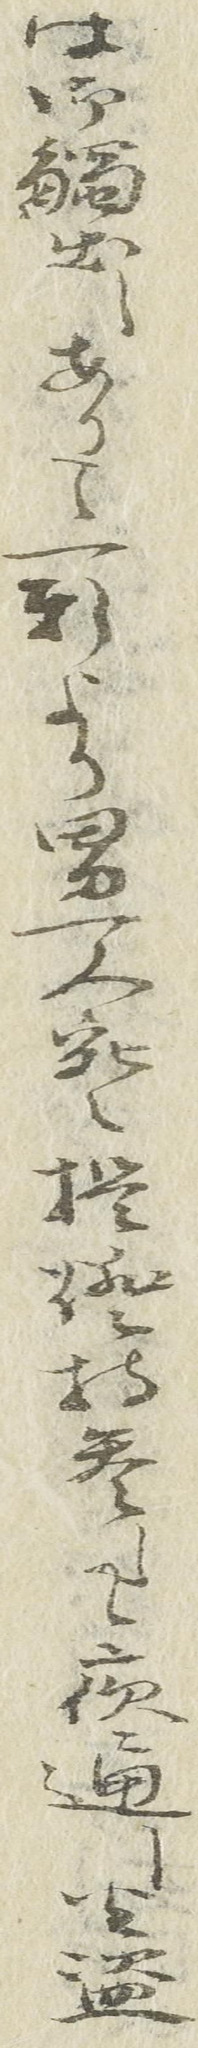は御触出しありて一軒より男一人宛之提燈持参して夜通し火盗
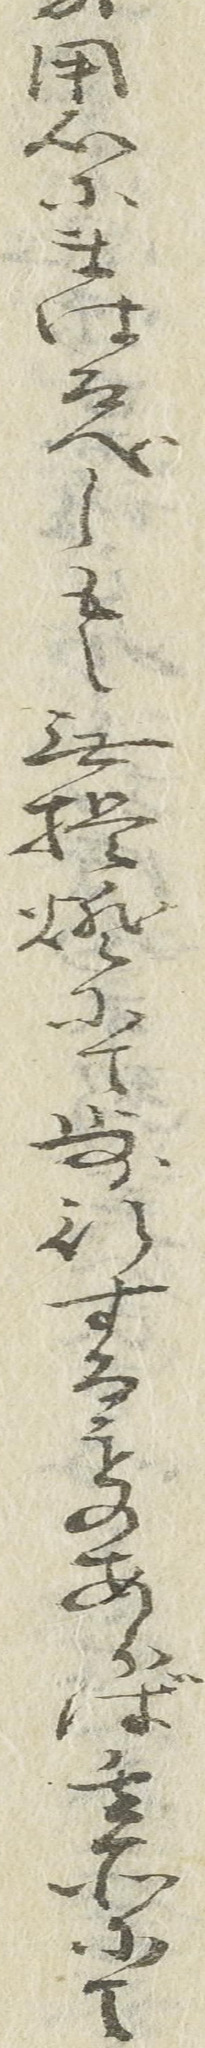の用心にまはるべしもし無提燈にて歩行するものあらば其所にて
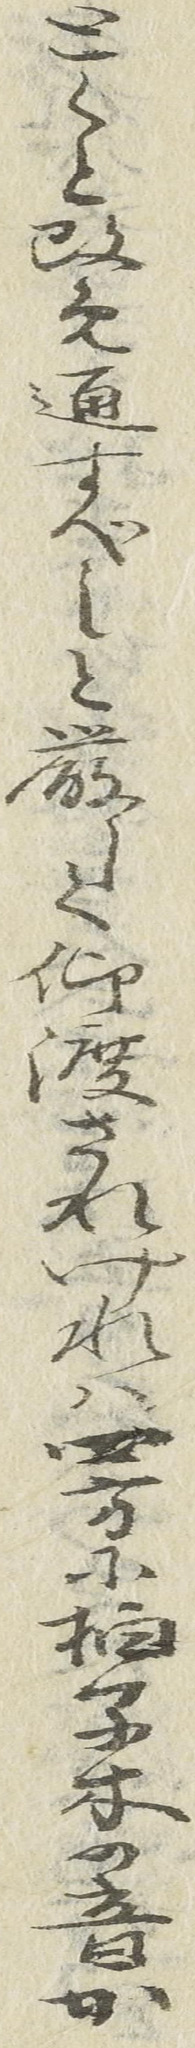とくと改め通すべしと厳しく仰渡されけれは四方に拍子木の音か
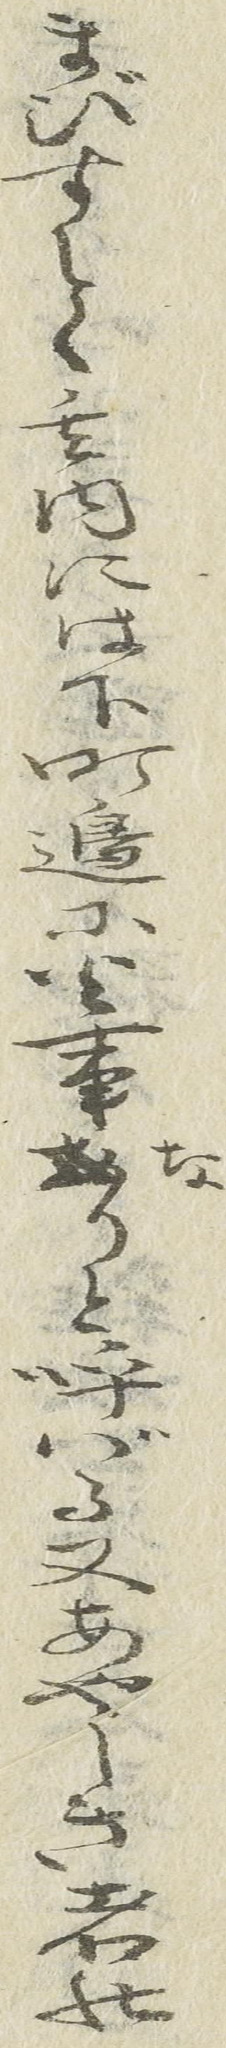まびすしく其内には下町辺に火事なりと呼ばる又あやしき者の
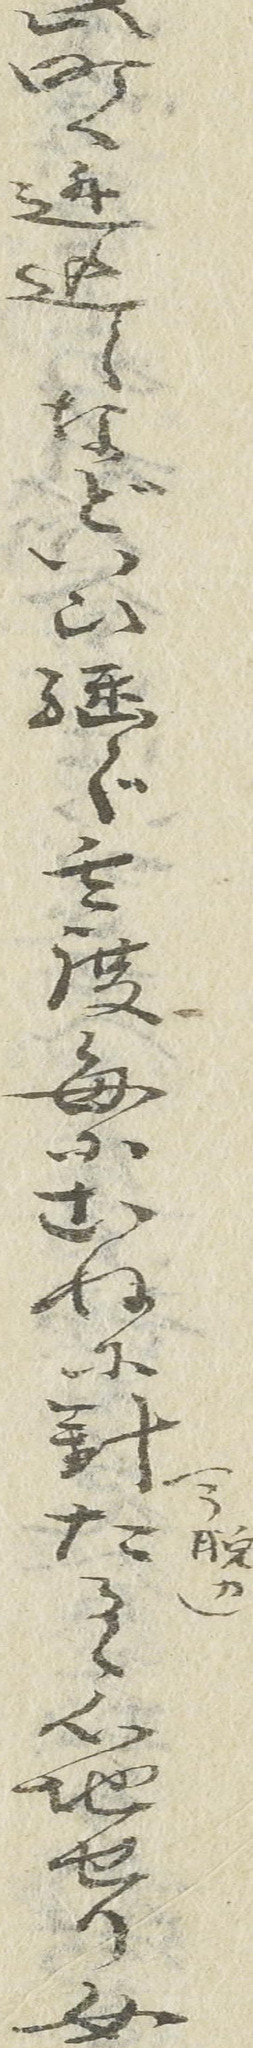此町へ逃込しなどいひ継ぐ其度毎にむねに針たるゝ心地せり女
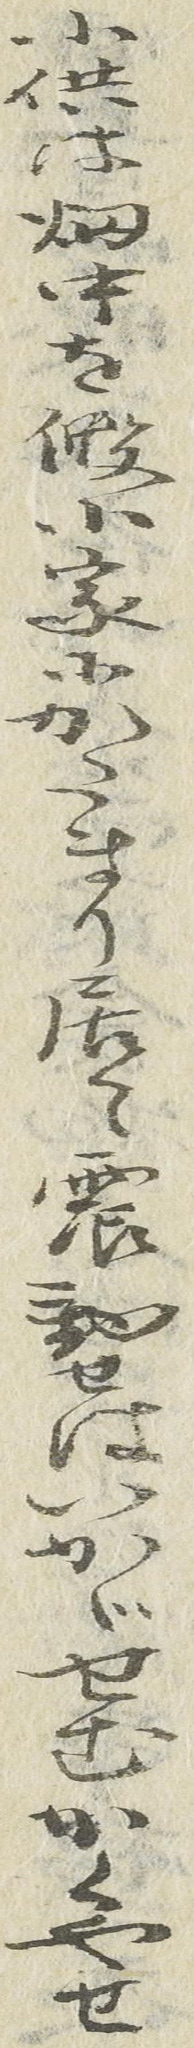子供は畑中を假小家にかたまり居て震動せはいかゞせむかくやせ
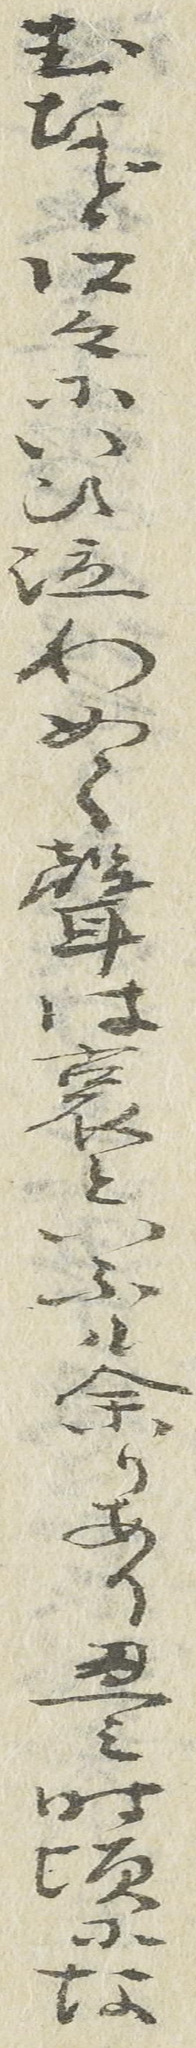むなど口々にいひ泣わめく聲は哀といふも余りあり丑三時頃にな
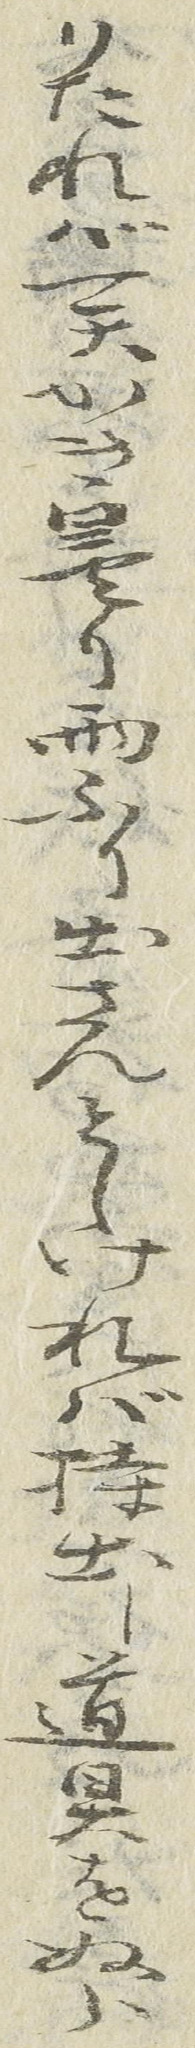りたれば一天かき曇り雨ふり出さんとしければ持出し道具をぬら
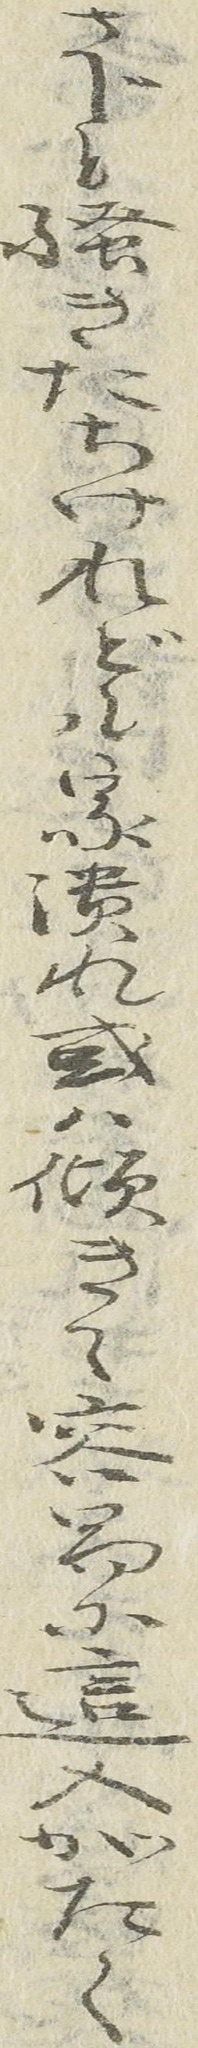さじと騒きたちけれども家潰れ或は傾きて容易に這入がたく

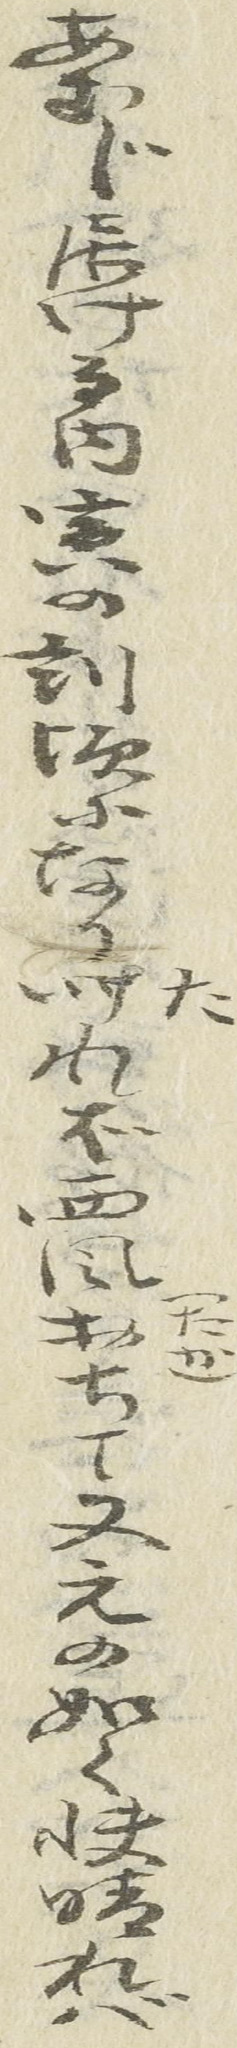案じ居ける内寅の刻頃になりたれば西風おちて又元の如く快晴れば
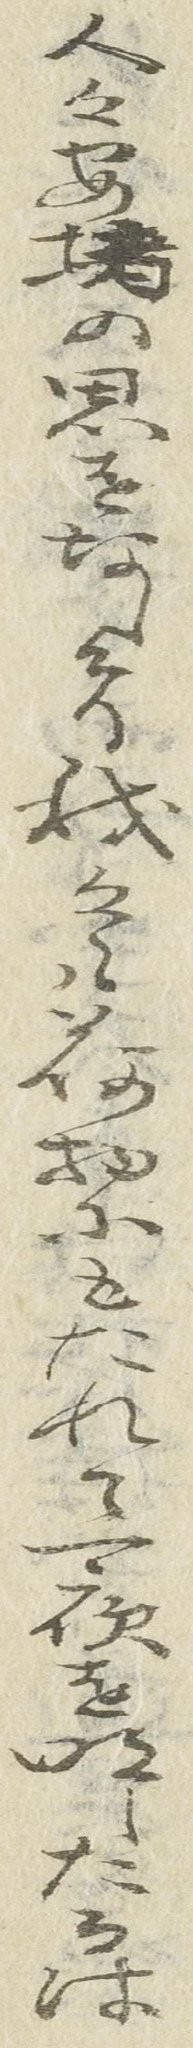人々安堵の思をなしけり我々も荷物にもたれて一夜を明したるは
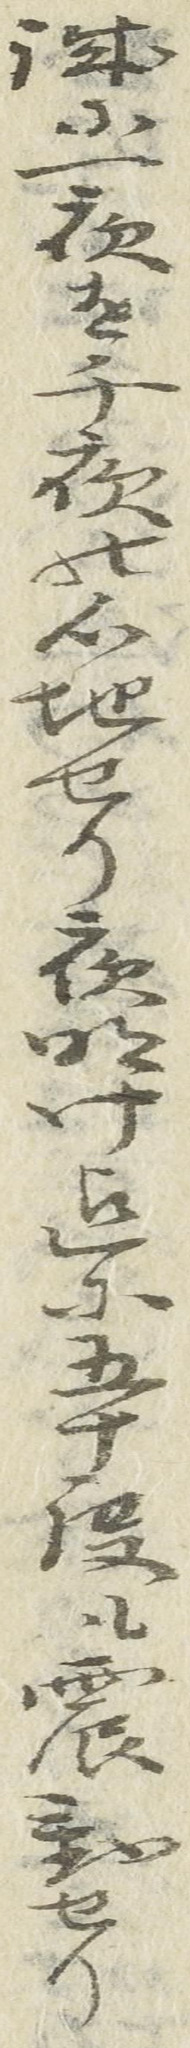誠に一夜を千夜の心地せり夜明け迄に五十度も震動せり
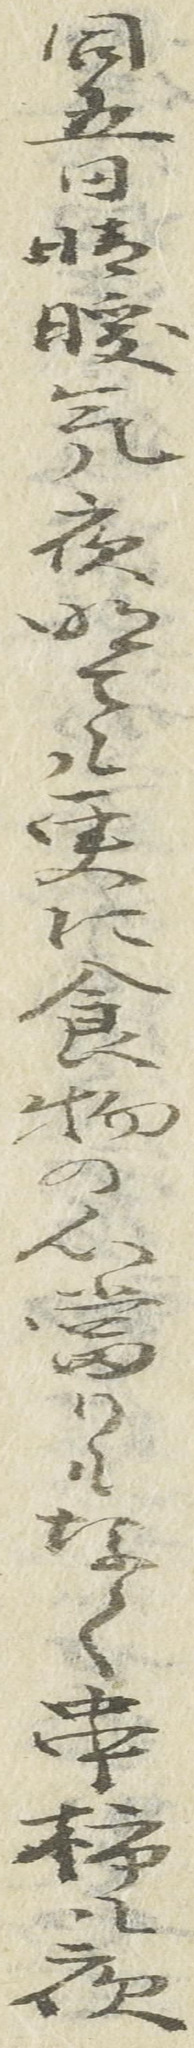同五日晴暖気夜明ても更に食物の心當りもなく串柿も夜
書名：地震前兆集　全
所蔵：東京大学地震研究所図書室 Earthquake Research Institute Library, The University of Tokyo, JAPAN
